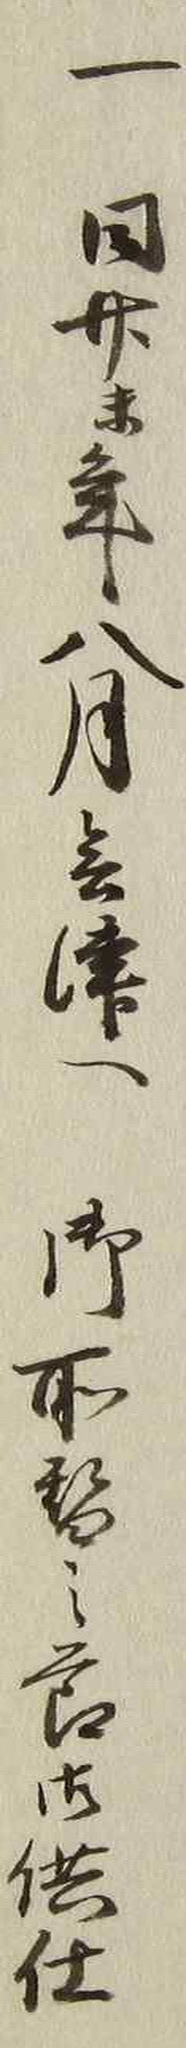一同廿未年八月会津へ御所替之節御供仕
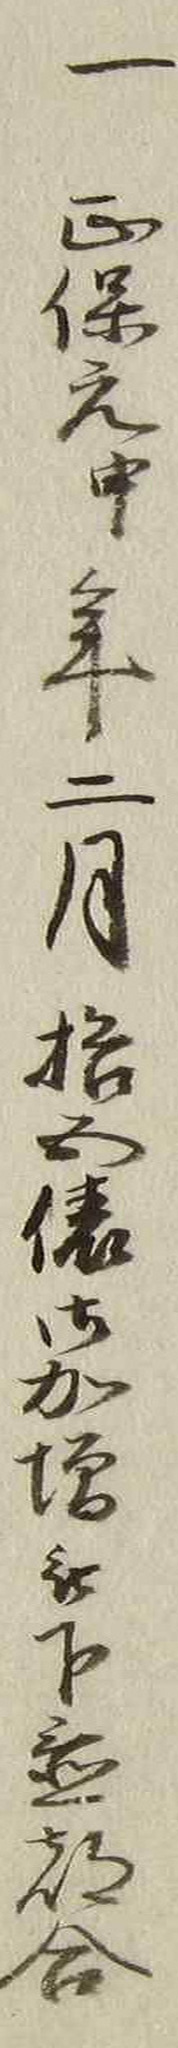一正保元申年二月拾五俵御加増被下置都合
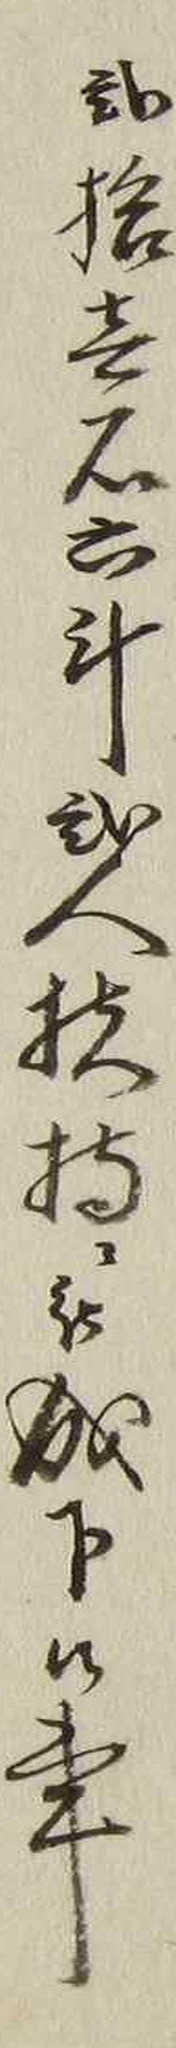弐拾壱石六斗弐人扶持ニ被成下候事
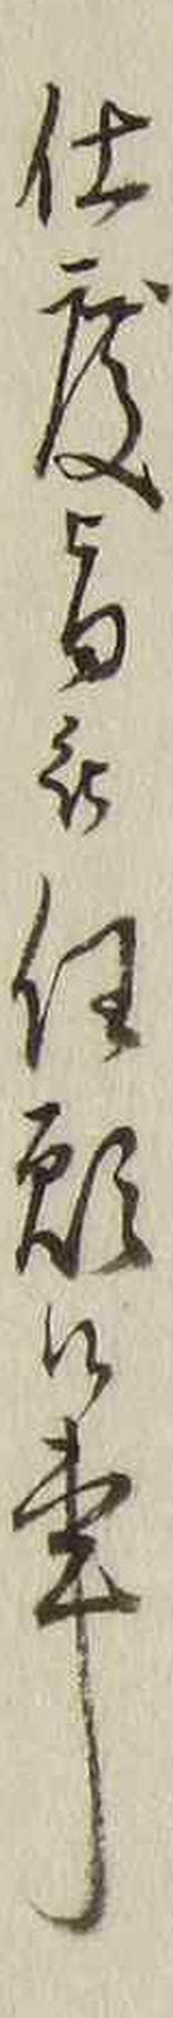仕度旨被任願候事
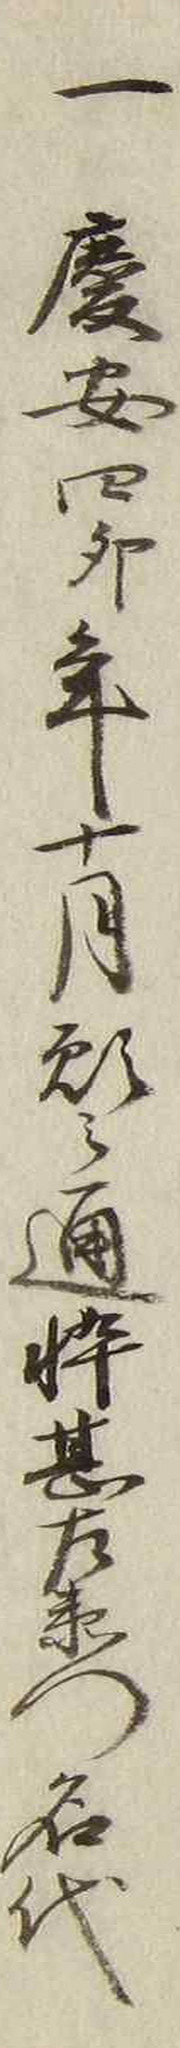一慶安四卯年十月願之通忰甚左衛門名代
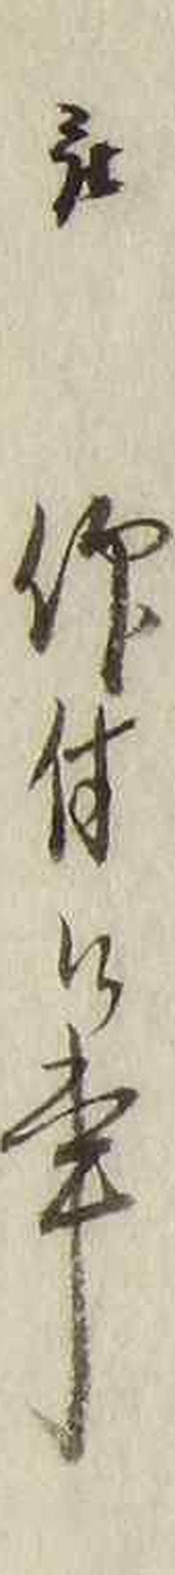被仰付候事

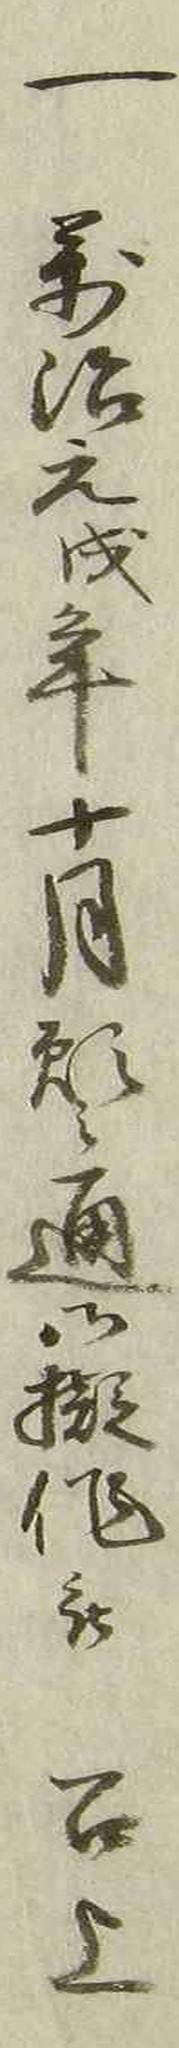一万治元戌年十月願之通御擬作被召上
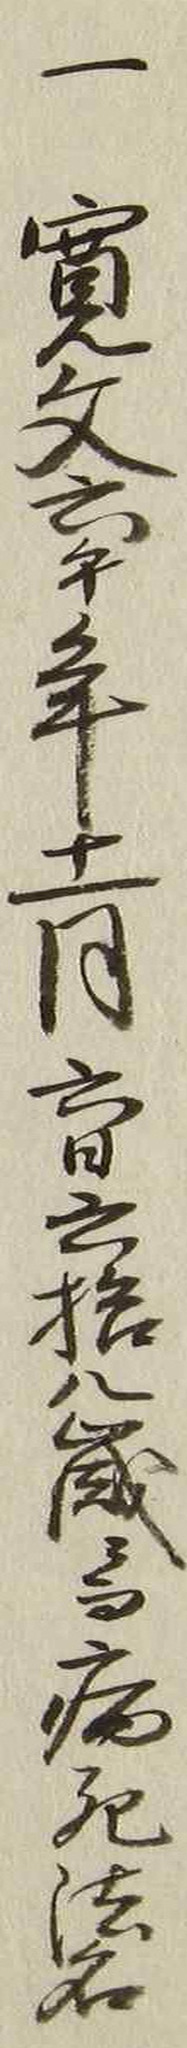一寛文六午年十一月六日六拾八歳ニ而病死法名
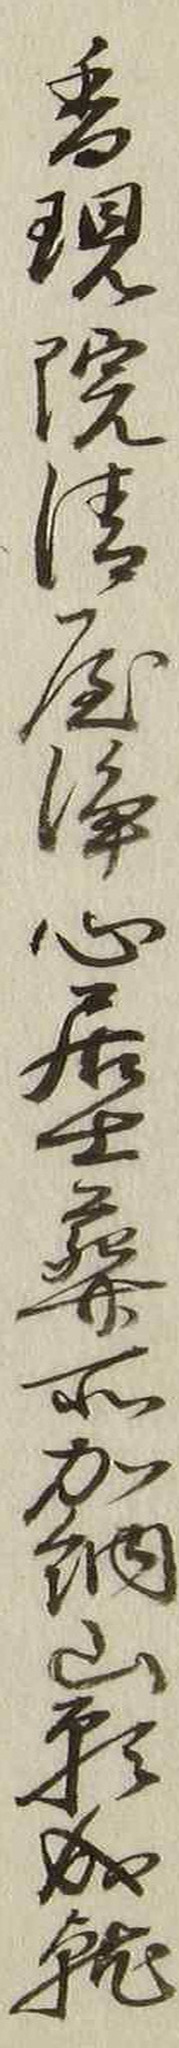香現院清屋浄心居士葬所加納山願成就
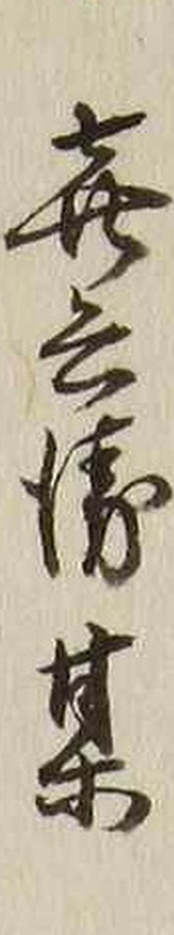喜兵衛某
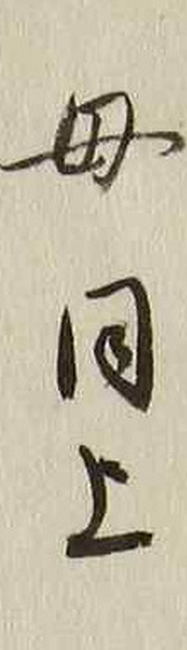母同上
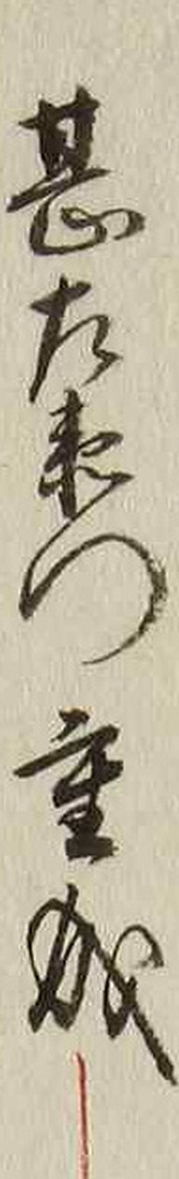甚左衛門重成
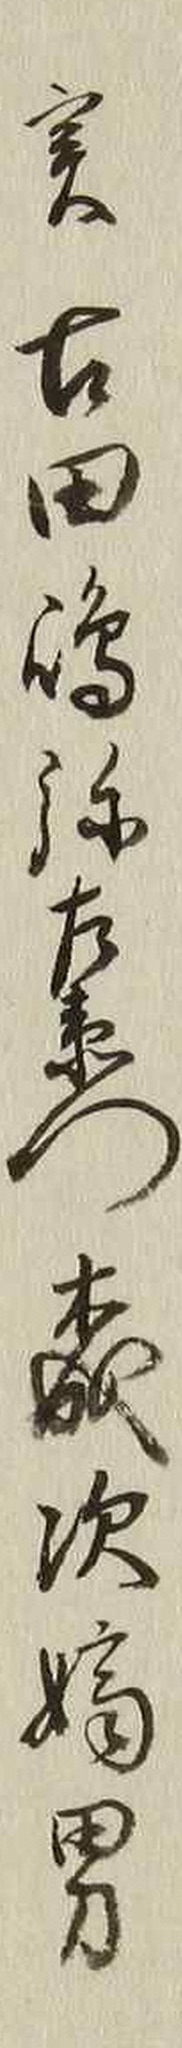実古田島弥左衛門森次嫡男
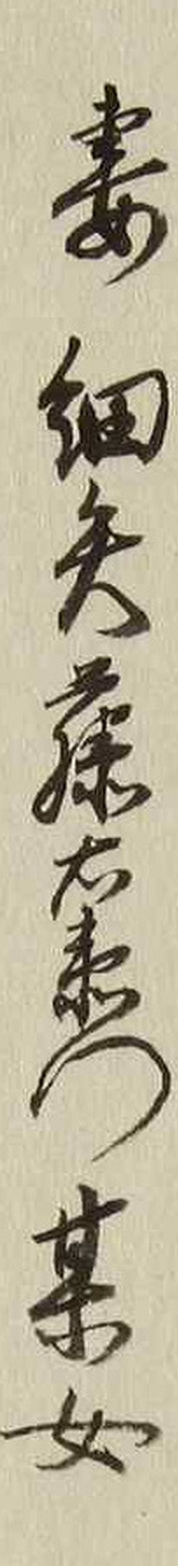妻細矢藤右衛門某女
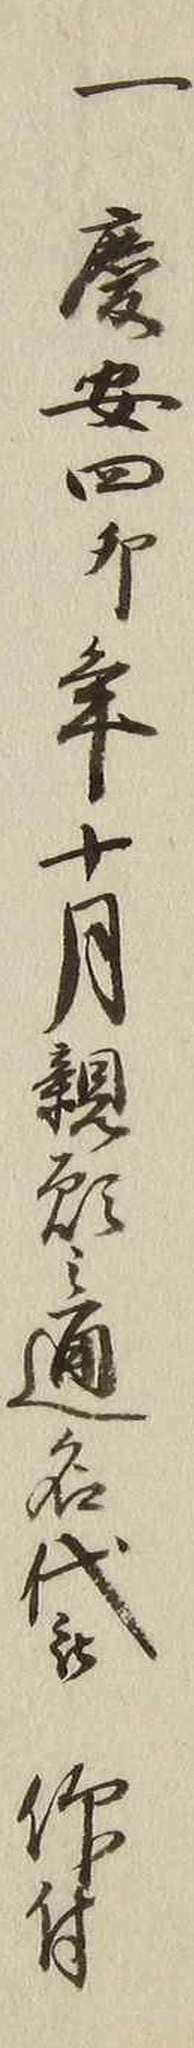一慶安四卯年十月親願之通名代被仰付
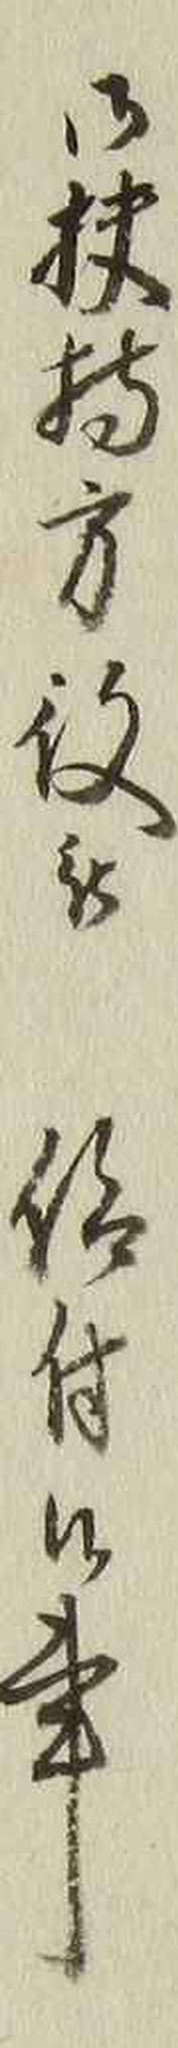御扶持方役被仰付候事
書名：諸士系譜　巻之128　た之部4
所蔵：会津若松市立会津図書館
